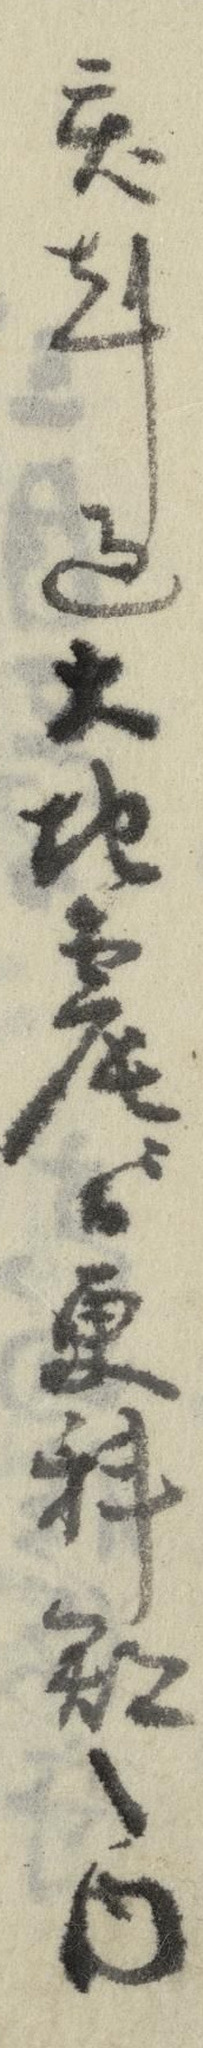亥刻過大地震ニ付更科郡之内
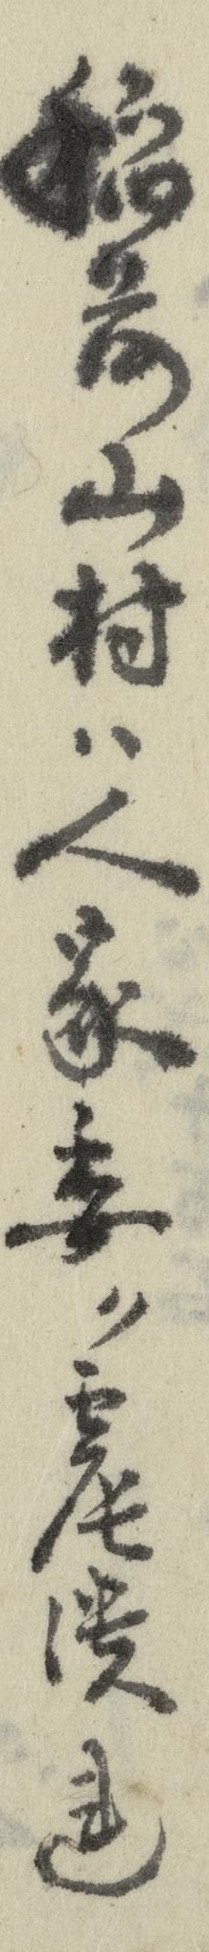稲荷山村ハ人家委ク震潰れ
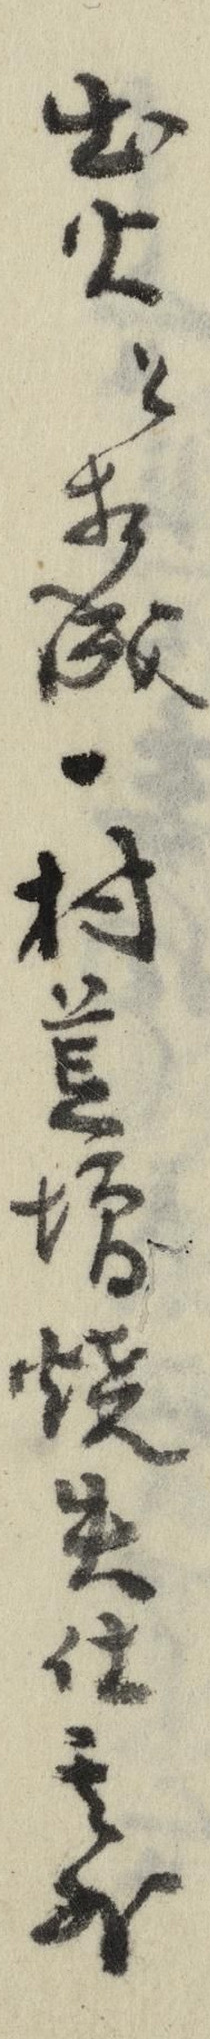出火と相成一村荒増焼失仕其外
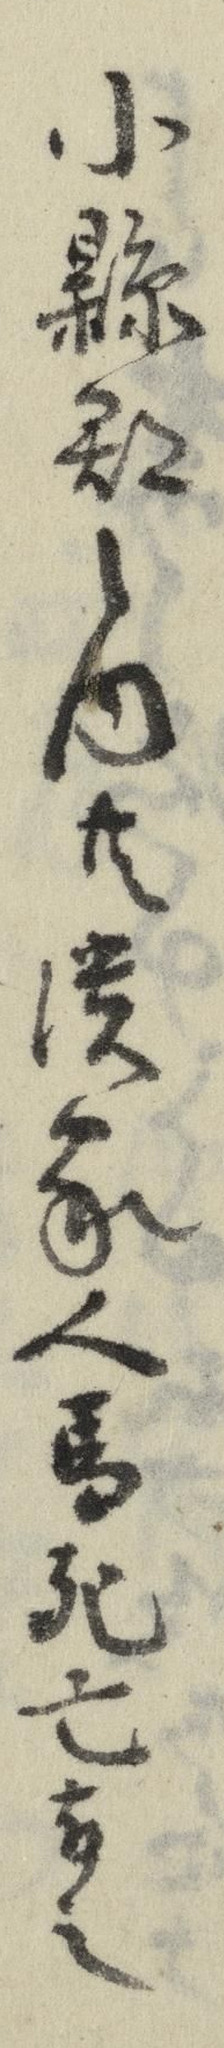小県郡之内共潰家人馬死亡有之
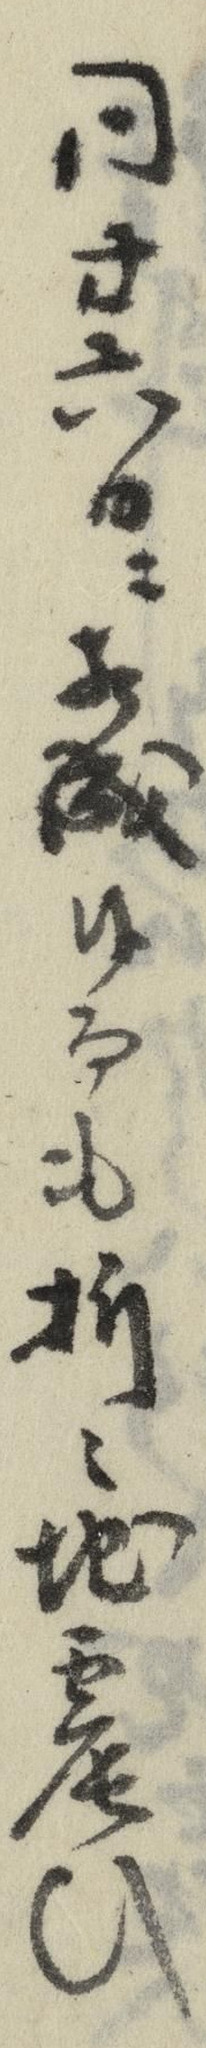同廿六日ニ相成候而も折々地震ひ
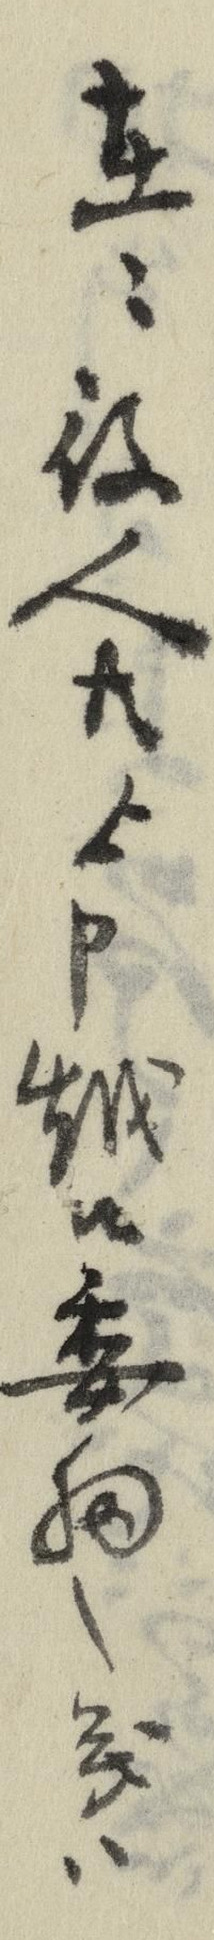在々役人共ゟ申越候委細之義ハ
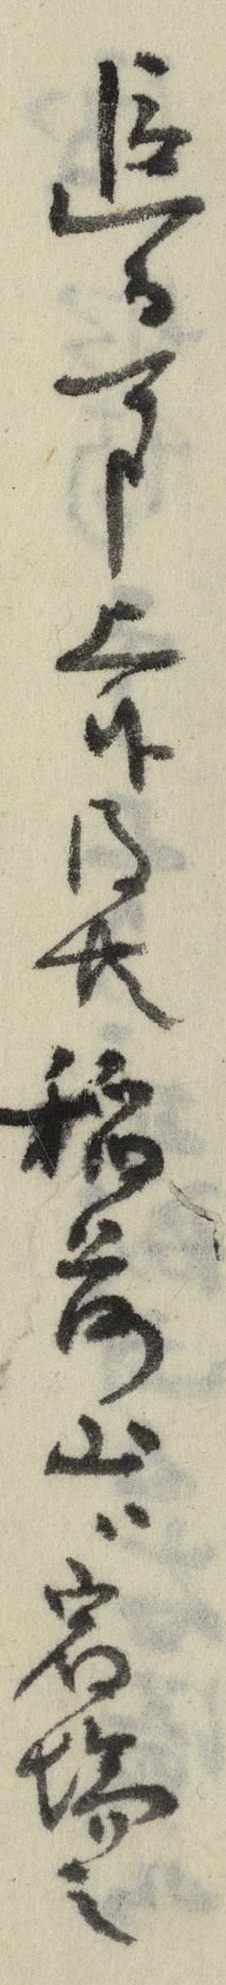追而可申上候得共稲荷山ハ宿場之
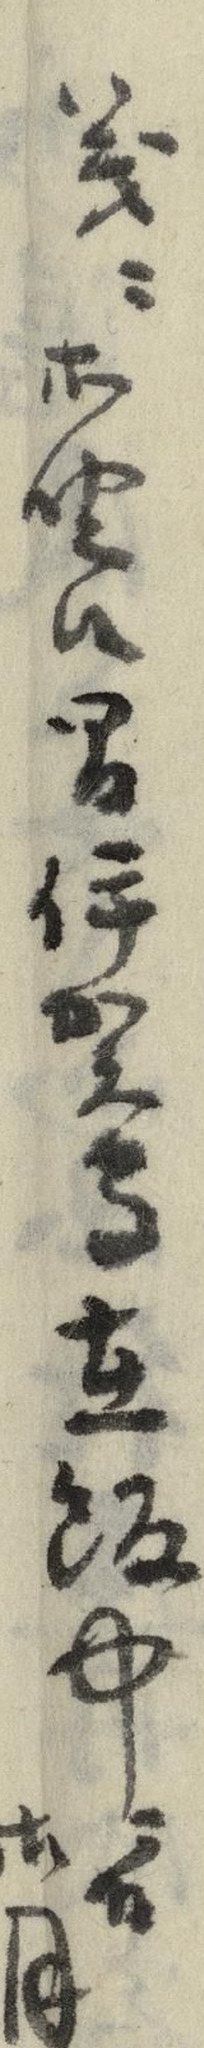義ニ御坐候間伊賀守在飯中ニ付御月
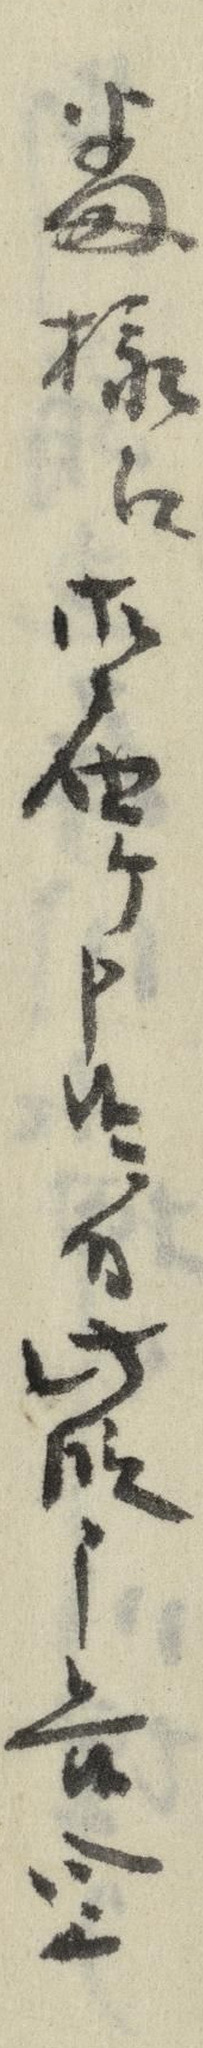番様え御届ケ申候ニ付此段申上候以上
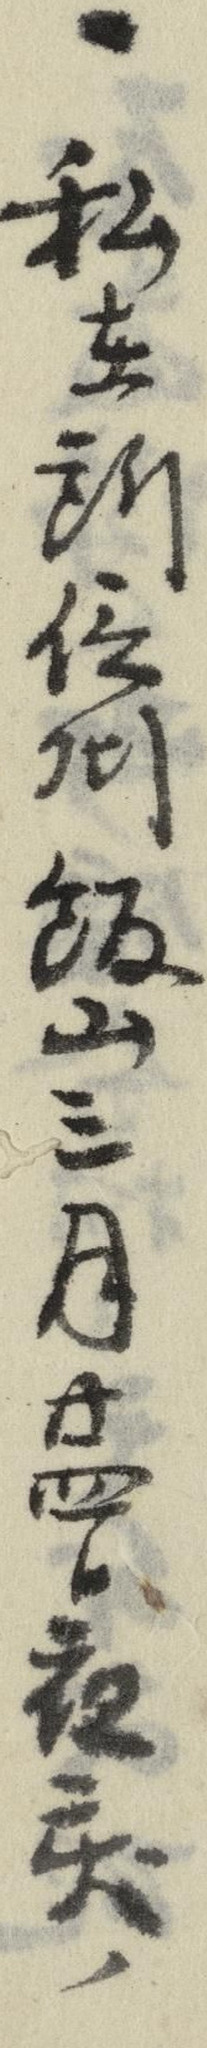一私在所信州飯山三月廿四日夜亥ノ
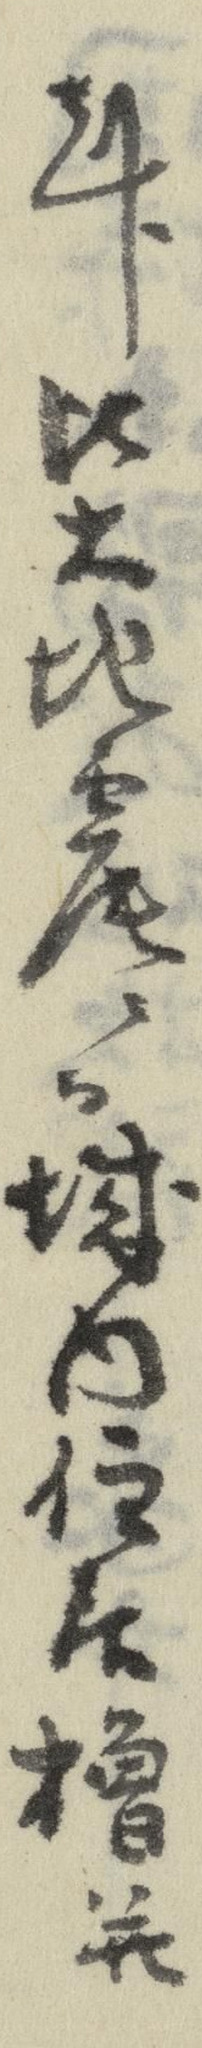刻比大地震ニ付城内住居櫓并
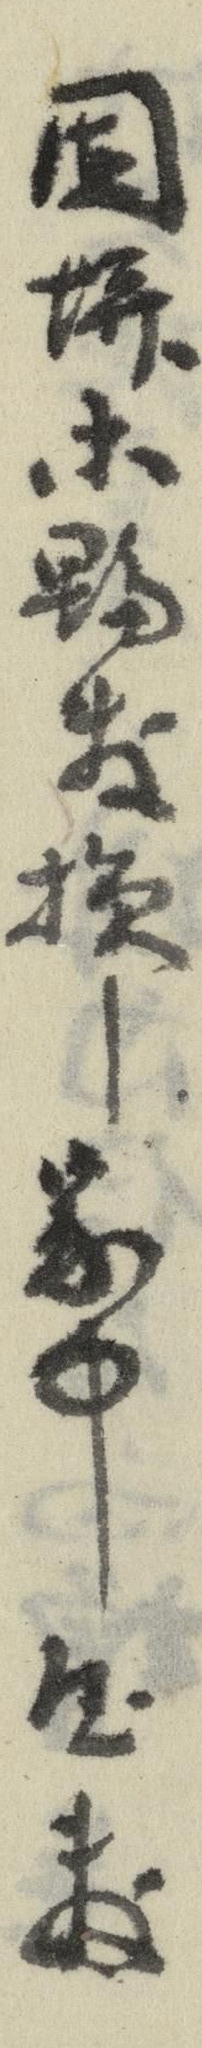固塀等夥敷損し家中屋敷
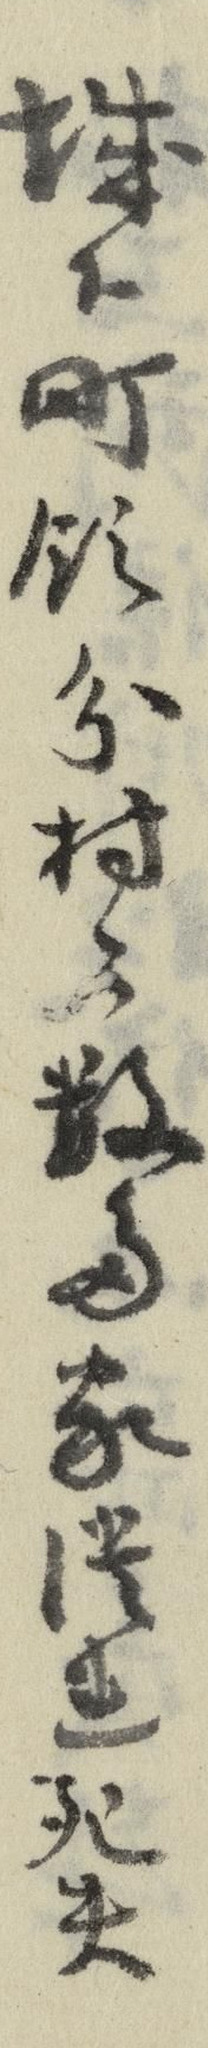城下町領分村々数多家潰れ死失
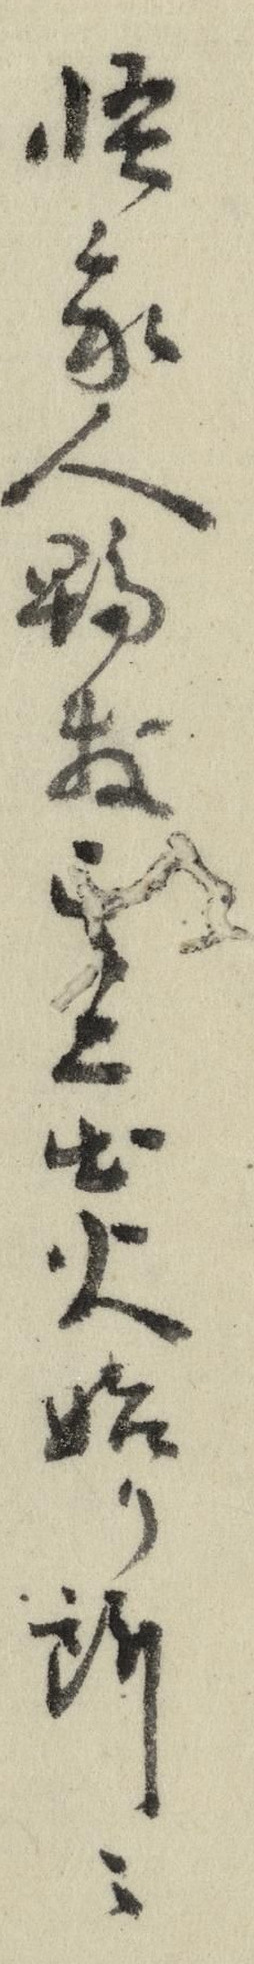怪我人夥敷其上出火始リ所々
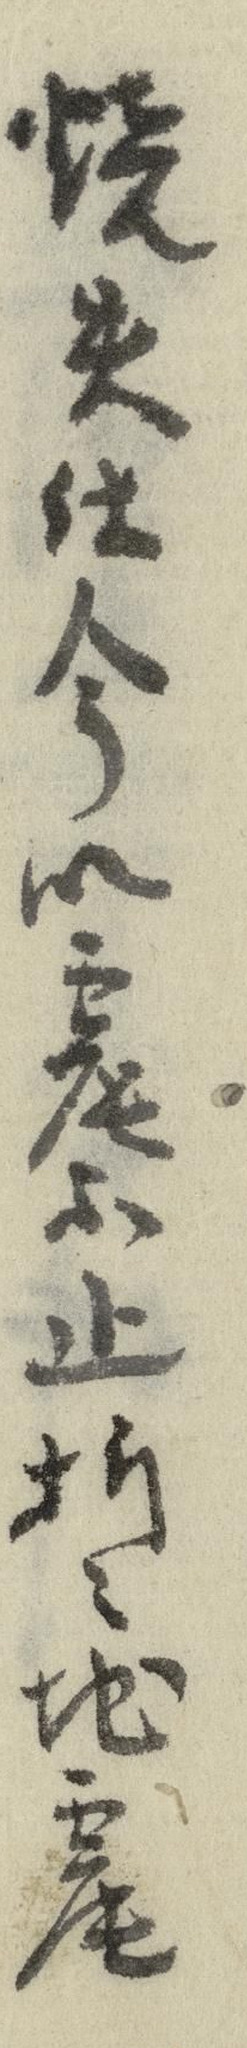焼失仕今以震不止折々地震
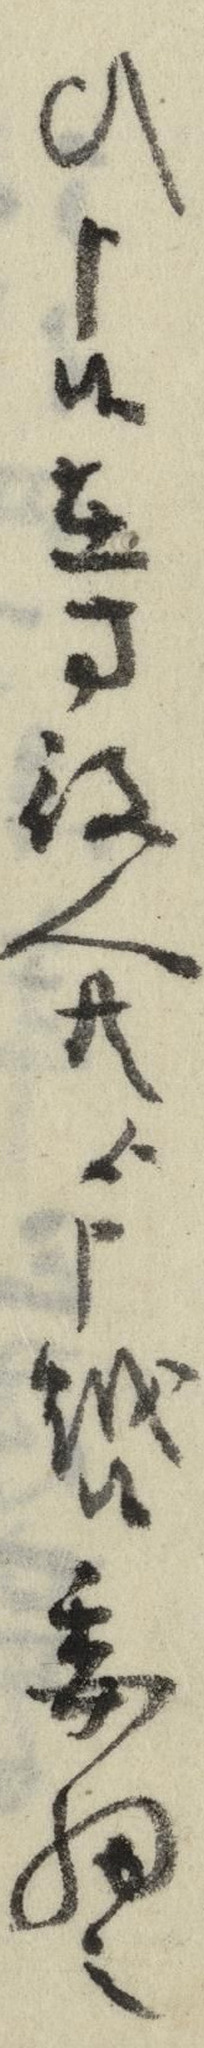ひ申候在方役人共ゟ申越候委細之
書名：信州大地震一件之冩　丁未弘化四年三月吉日
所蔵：東京大学地震研究所図書室 Earthquake Research Institute Library, The University of Tokyo, JAPAN
